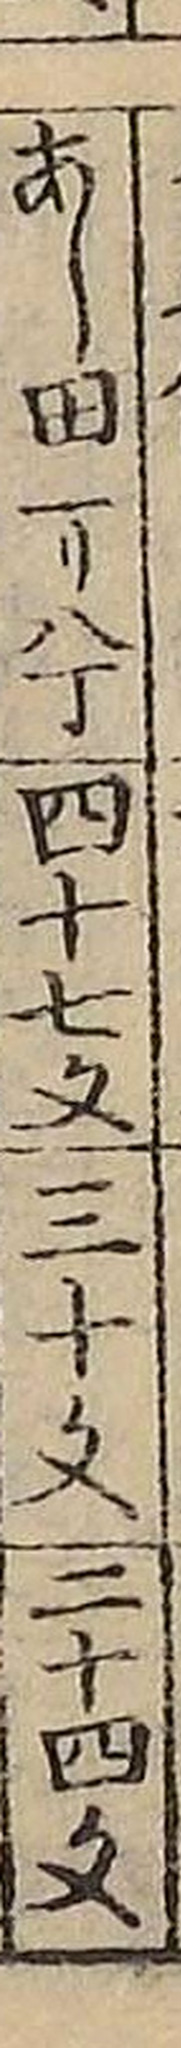あし田一リ八丁四十七文三十文二十四文
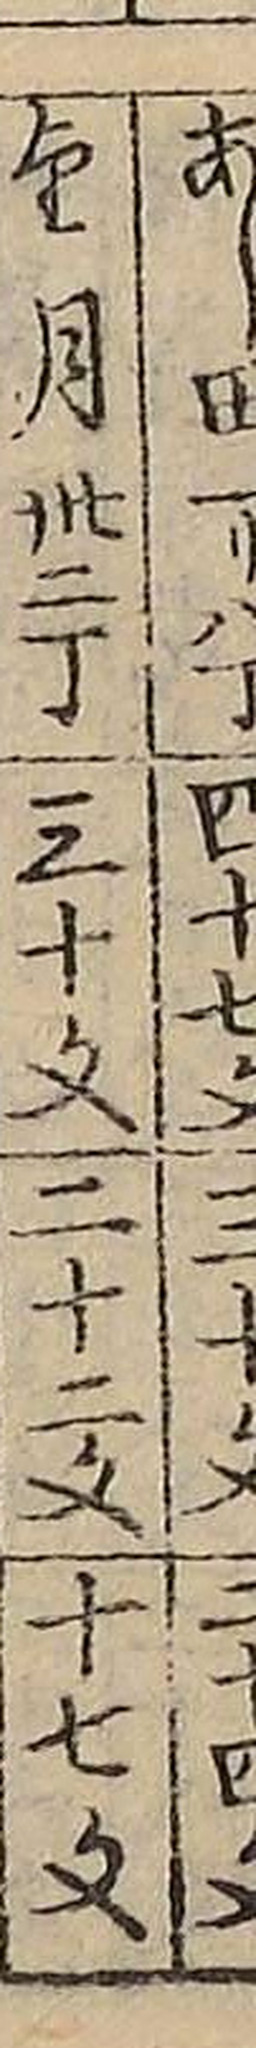望月卅二丁三十文二十二文十七文
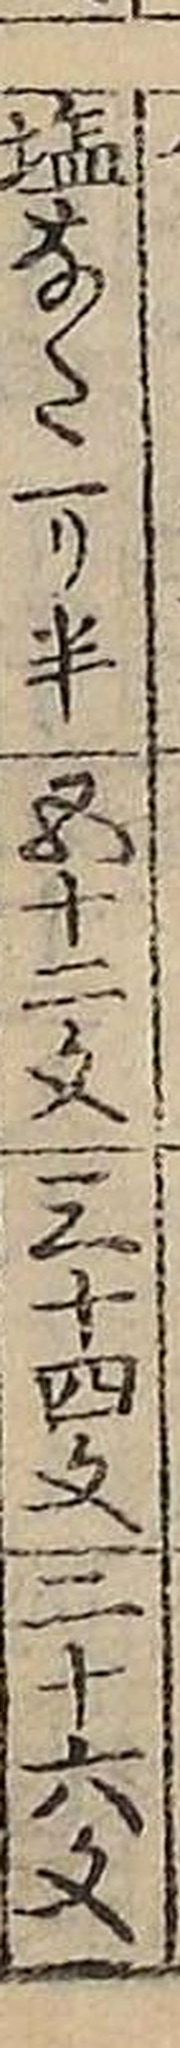塩なた一リ半五十二文三十四文二十六文
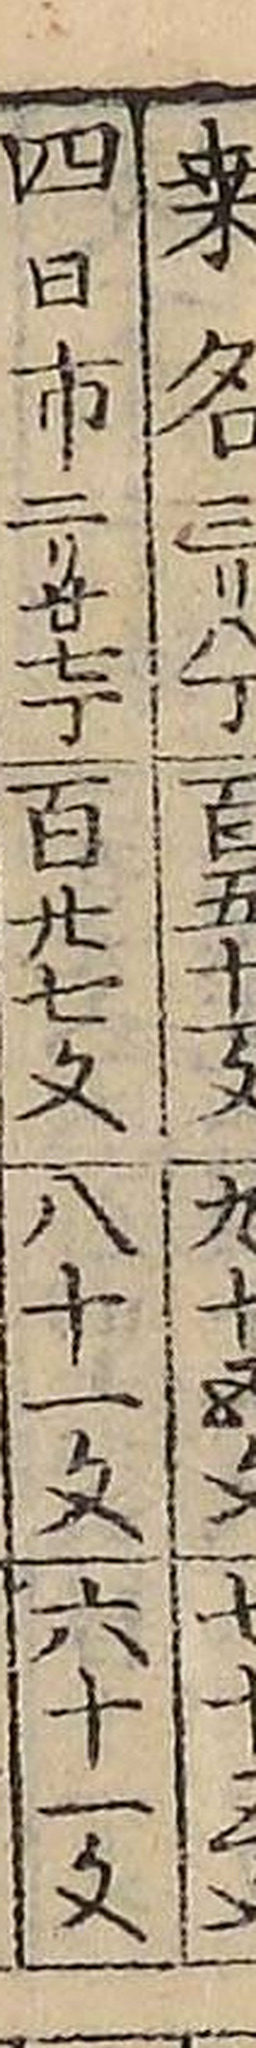四日市二リ廿七丁百廿七文八十一文六十一文
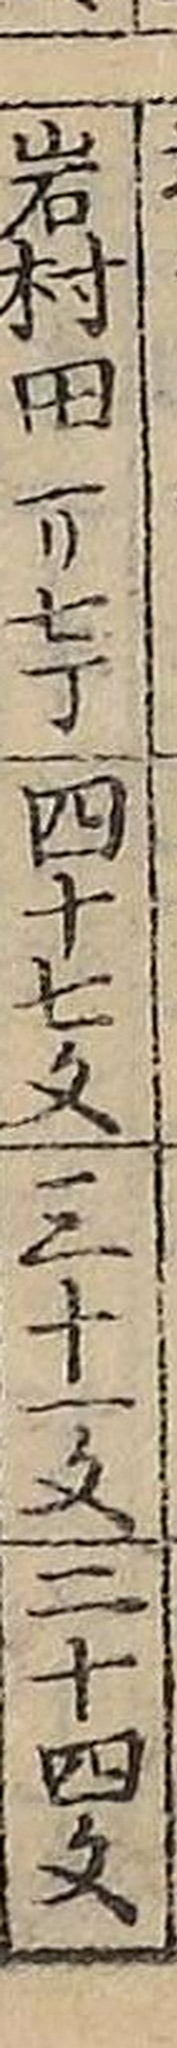岩村田一リ七丁四十七文三十一文二十四文
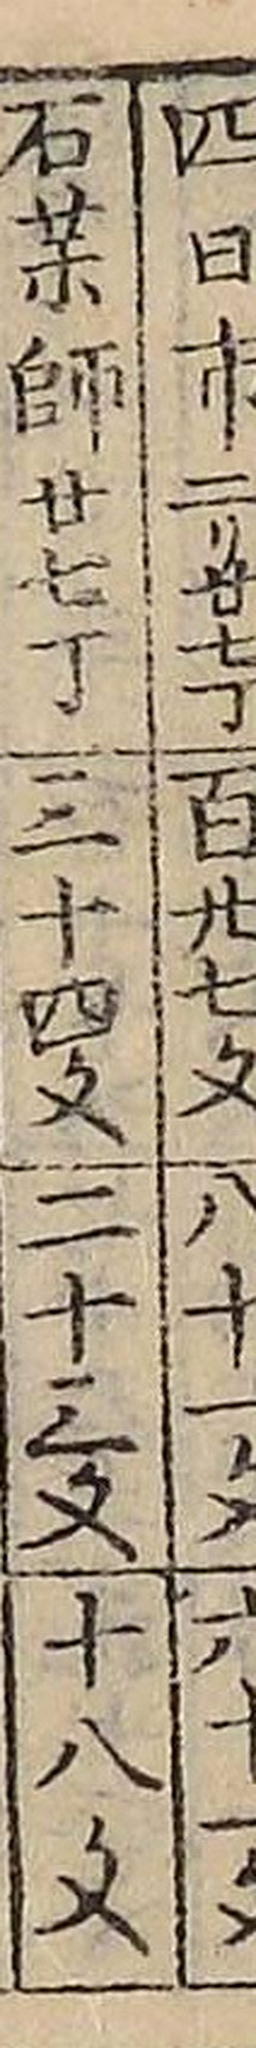石薬師廿七丁三十四文二十三文十八文
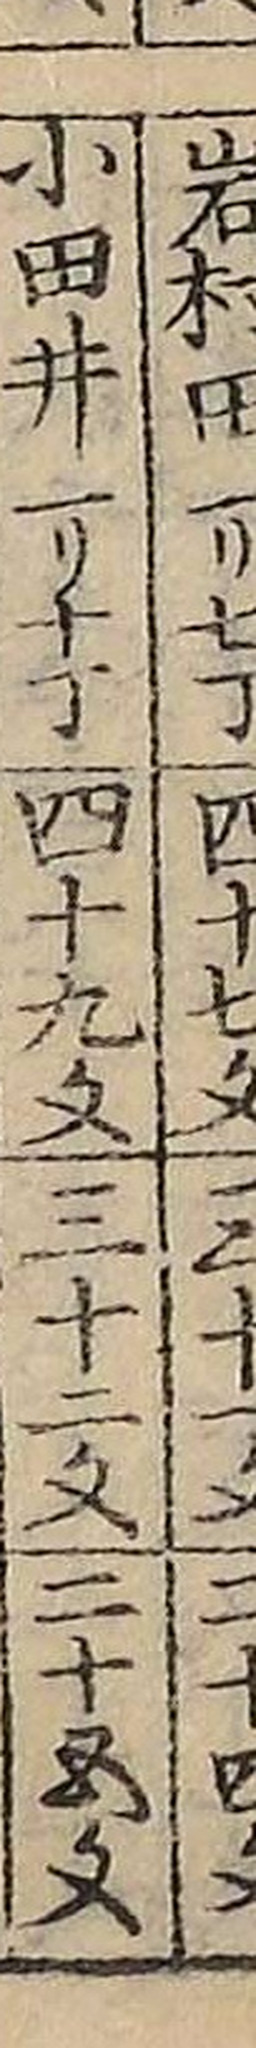小田井一リ十丁四十九文三十二文二十五文
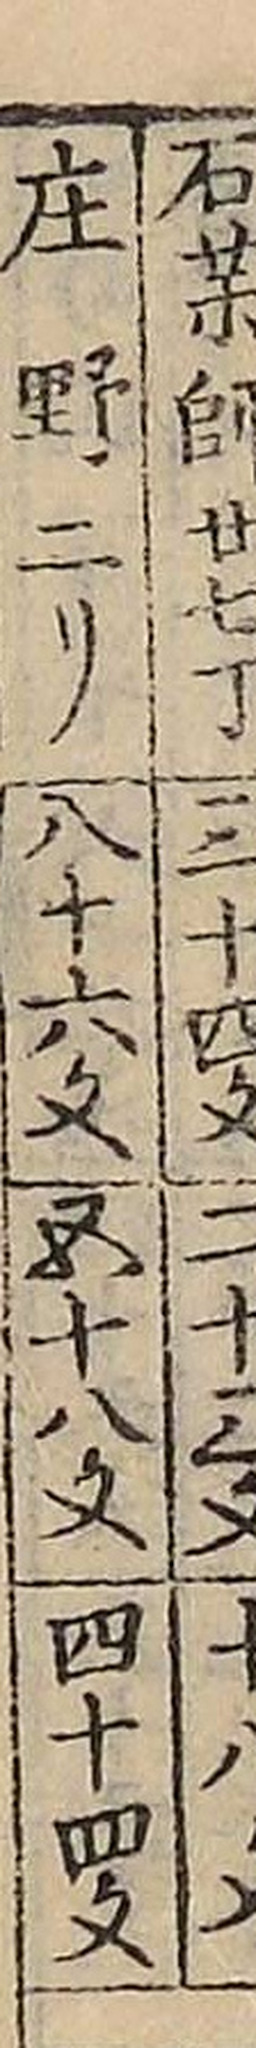庄野二リ八十六文五十八文四十四文
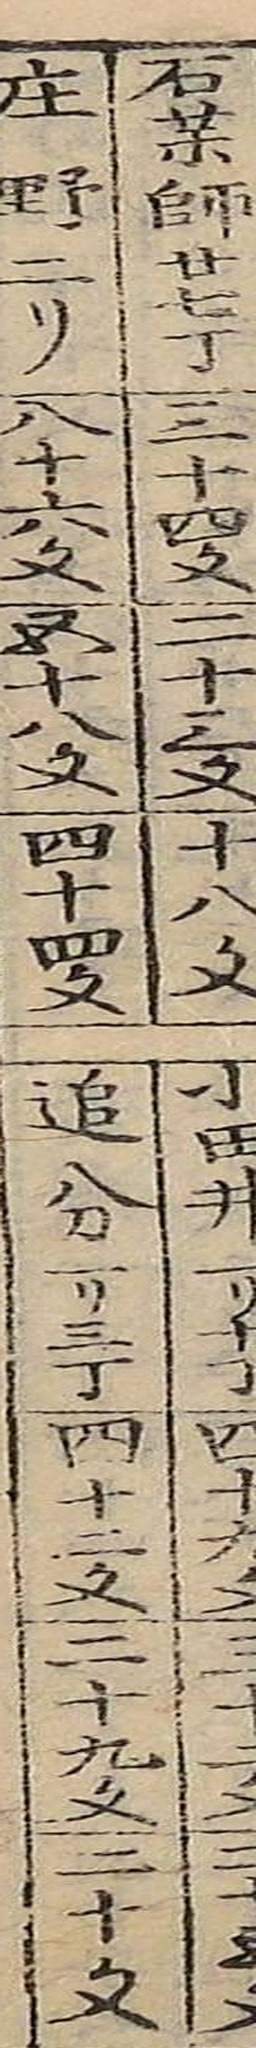庄野二リ八十六文五十八文四十四文
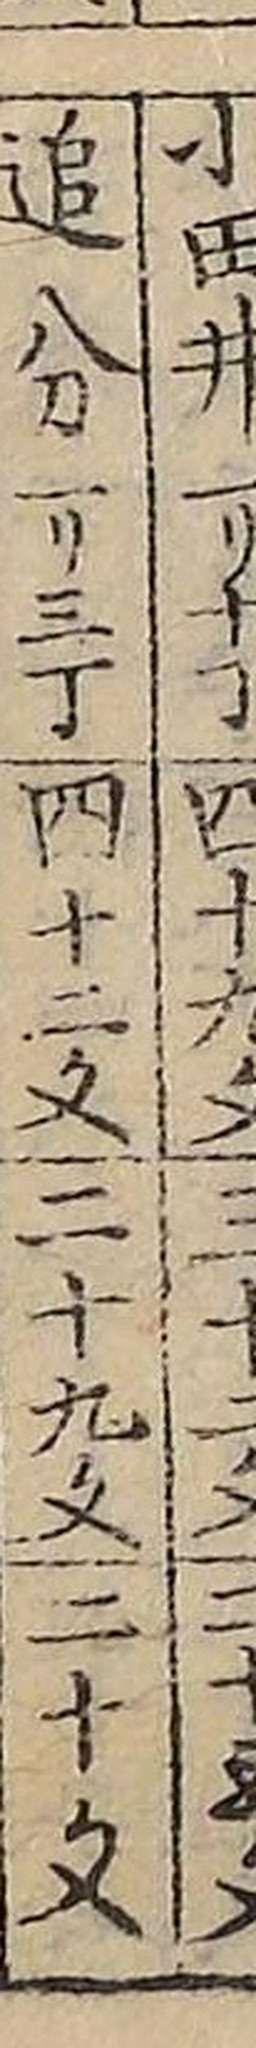追分一リ三丁四十二文二十九文二十文

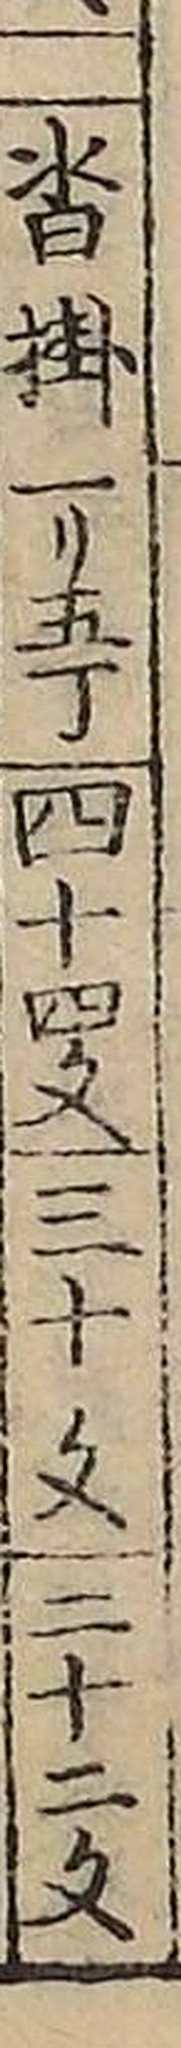沓掛一リ五丁四十四文三十文二十二文
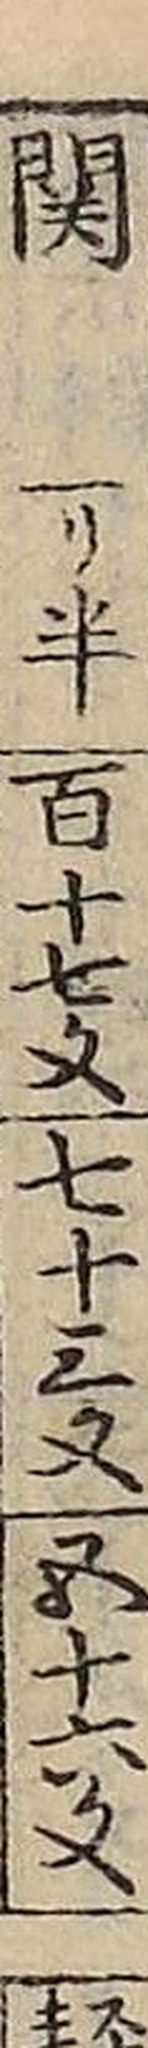関一リ半百十七文七十三文五十六文
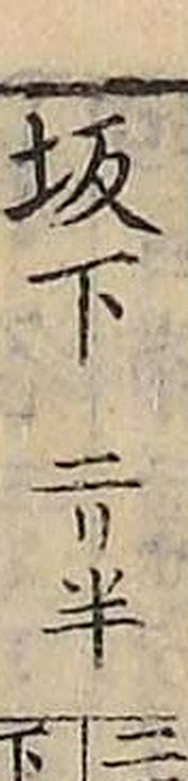坂下一リ半
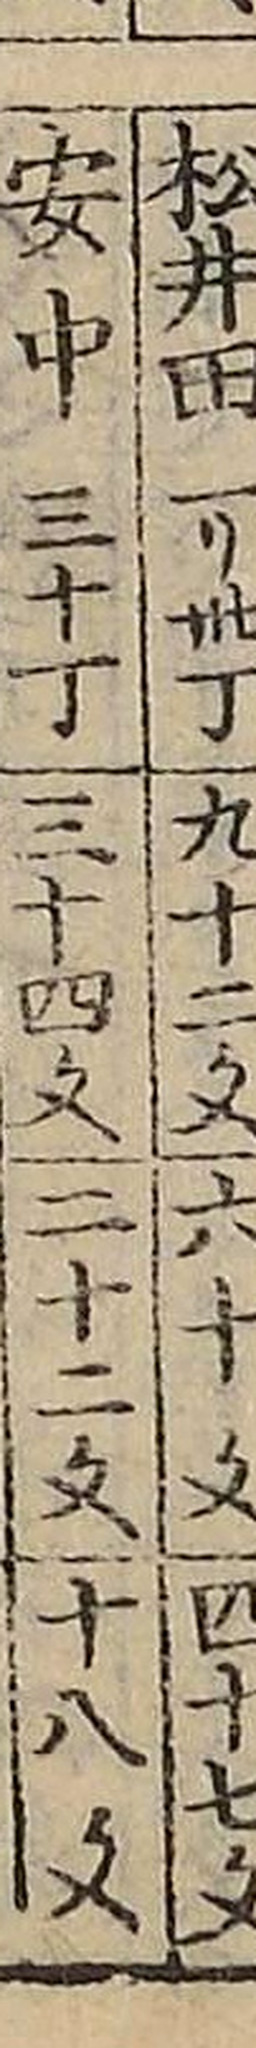安中三十丁三十四文二十二文十八文
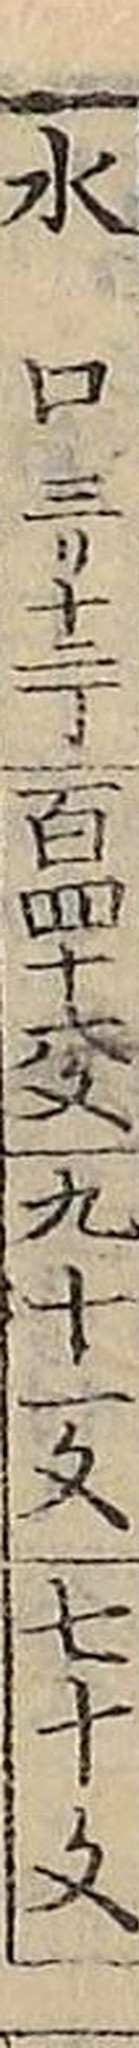水口三リ十二丁百四十六文九十一文七十文
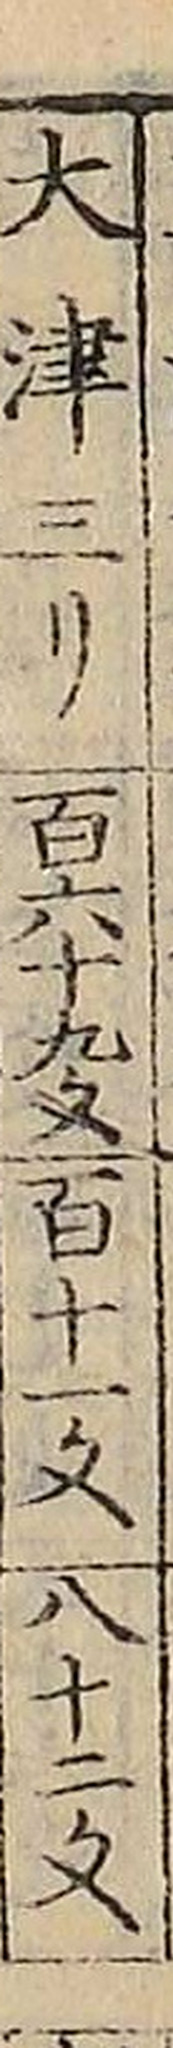大津三リ百六十九文百十一文八十二文
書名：旅行用心集
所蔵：神戸大学附属図書館 国文学研究資料館
